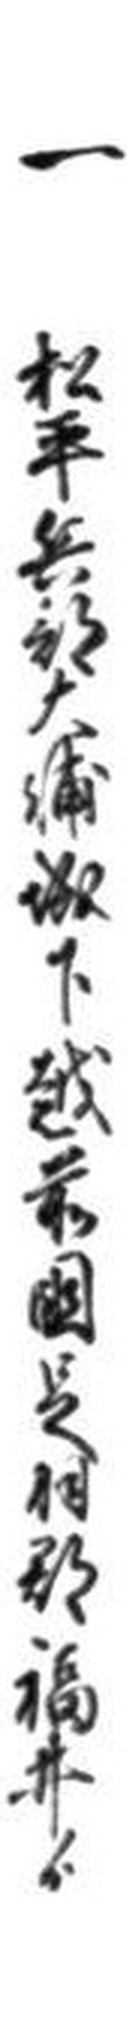一松平兵部大輔城下越前国足羽郡福井ゟ
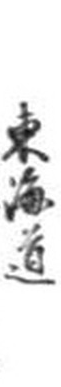東海道
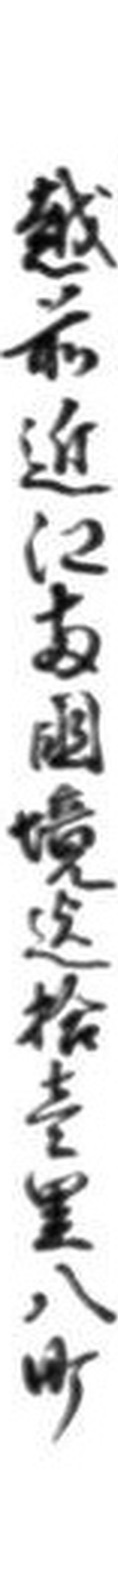越前近江両国境迄拾壱里八町
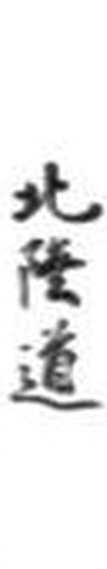北陸道
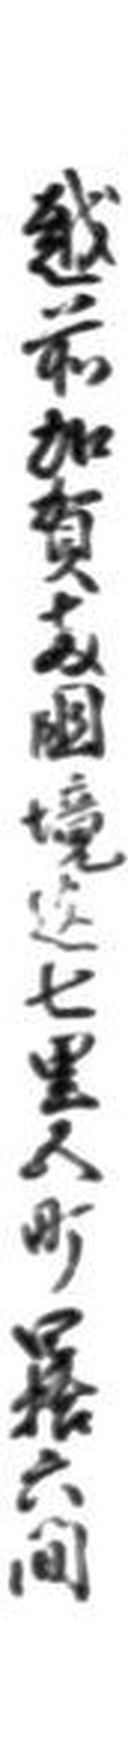越前加賀両国境迄七里五町四拾六間
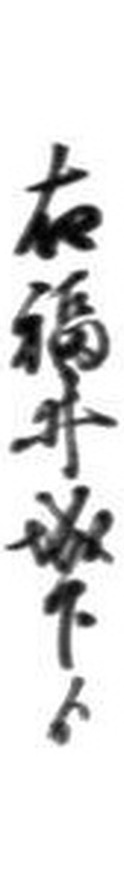右福井城下ゟ
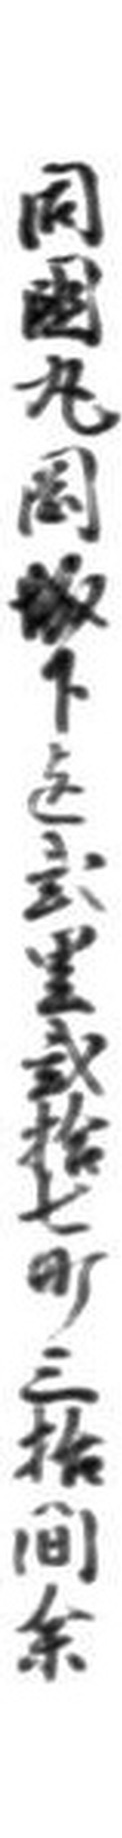同国丸岡城下迄弐里弐拾七町三拾間余
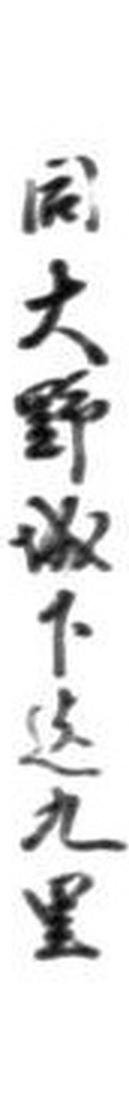同大野城下迄九里
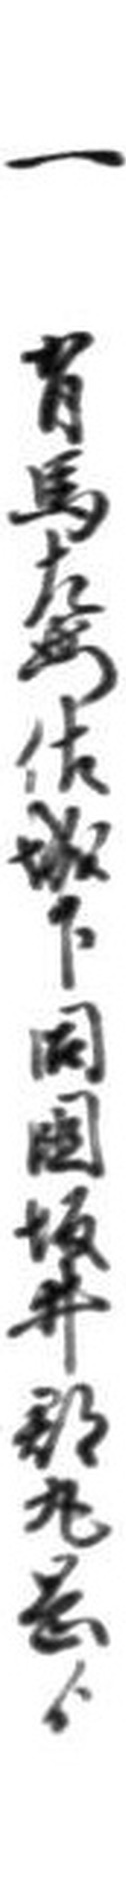一有馬左衛門佐城下同国坂井郡丸岡ゟ
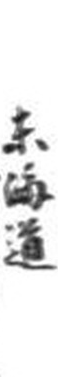東海道
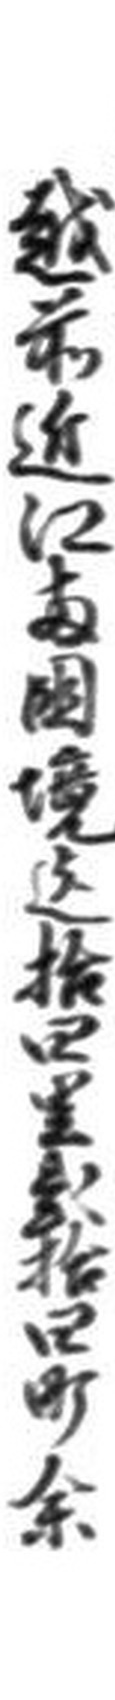越前近江両国境迄拾四里弐拾四町余

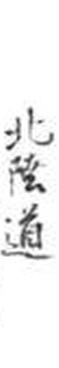北陸道
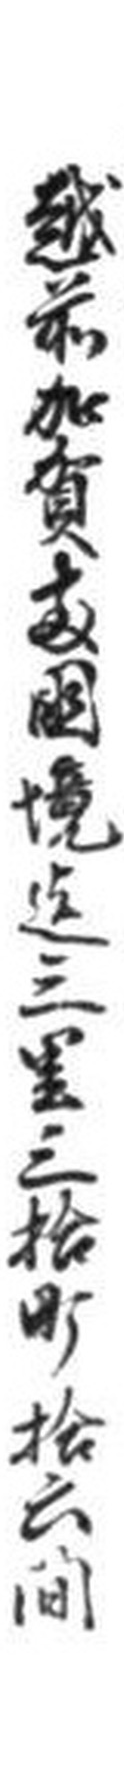越前加賀両国境迄三里三拾町拾六間
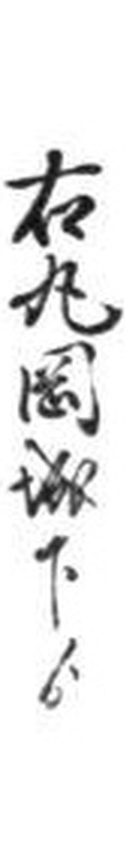右丸岡城下ゟ
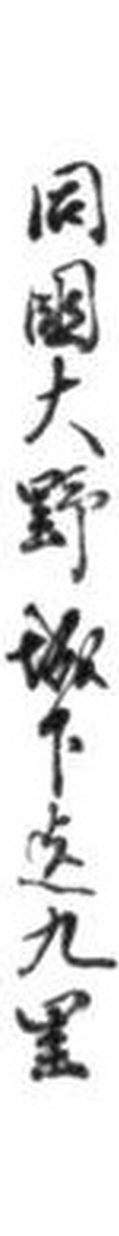同国大野城下迄九里
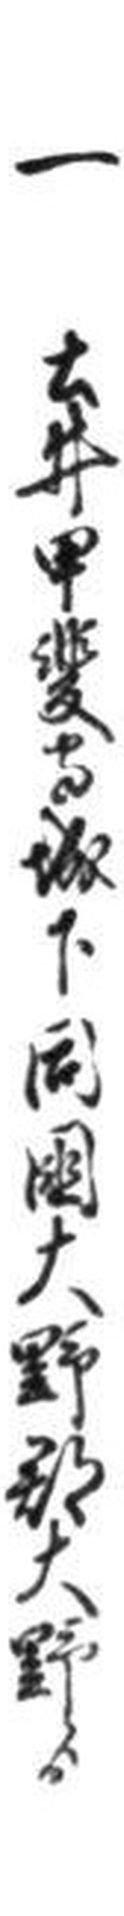一土井甲斐守城下同国大野郡大野ゟ
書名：家譜 二十二 吉品公 従元禄十五年到同十六年
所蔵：福井県文書館 Fukui Prefectural Archives
